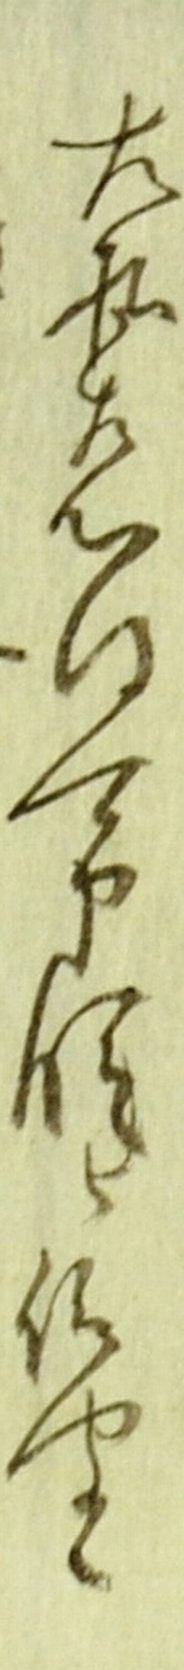左様相心得可申候被仰聞候
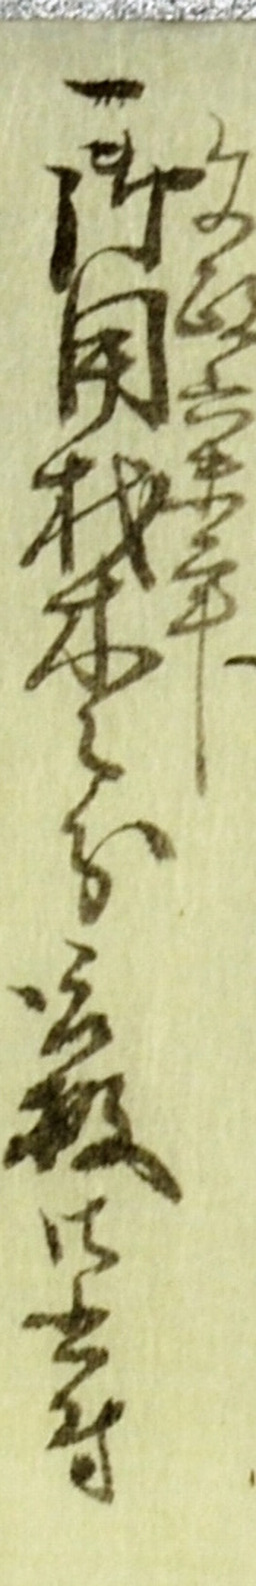一御用材木之分取数御書付
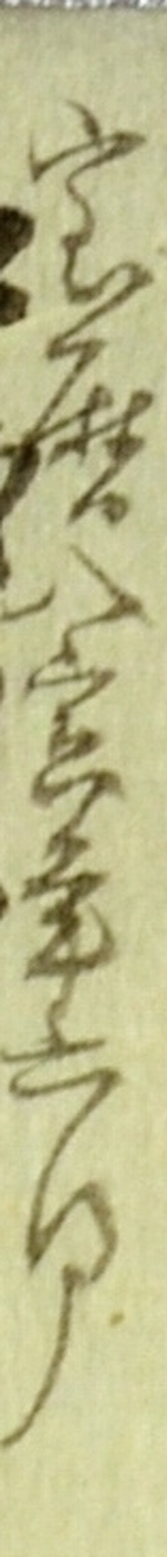宝暦八寅年六月
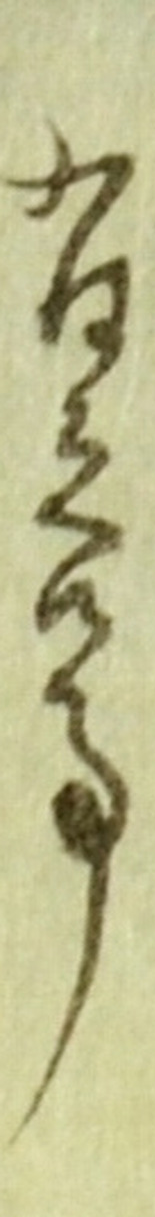有之候事
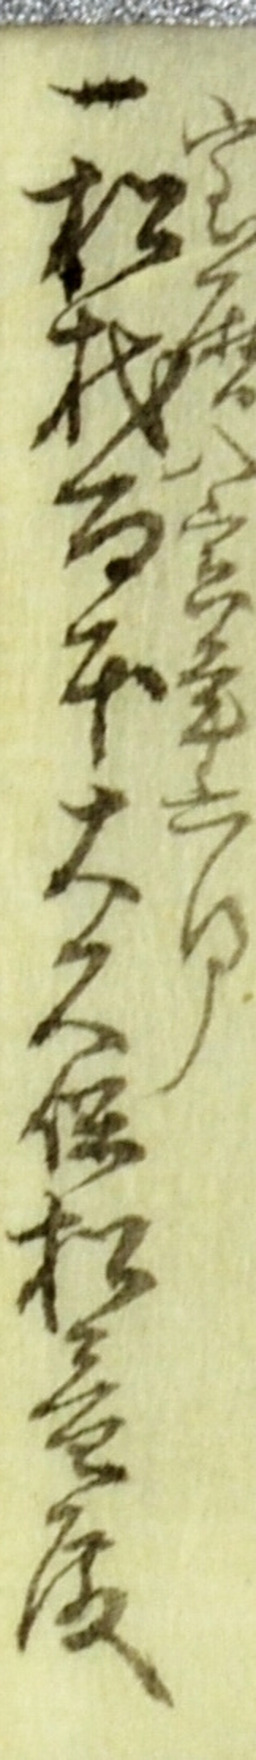一松材百本大久保松三四殿
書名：分一御定法
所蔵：伊那市立高遠町図書館・合同会社AMANE
